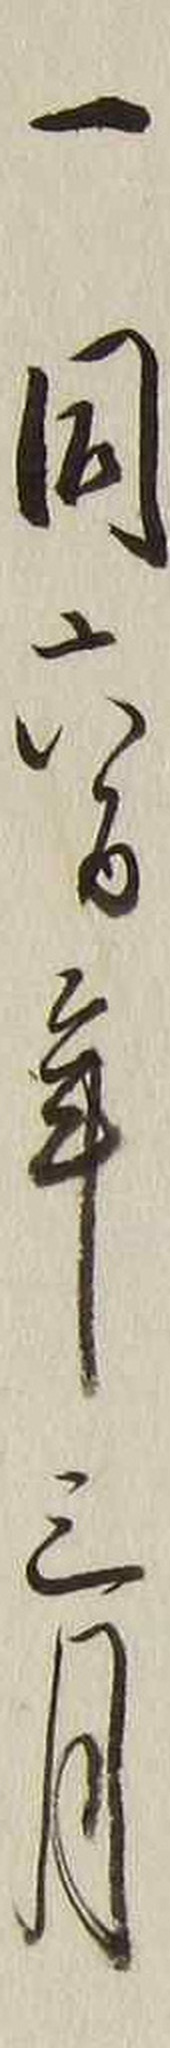一同六酉年三月
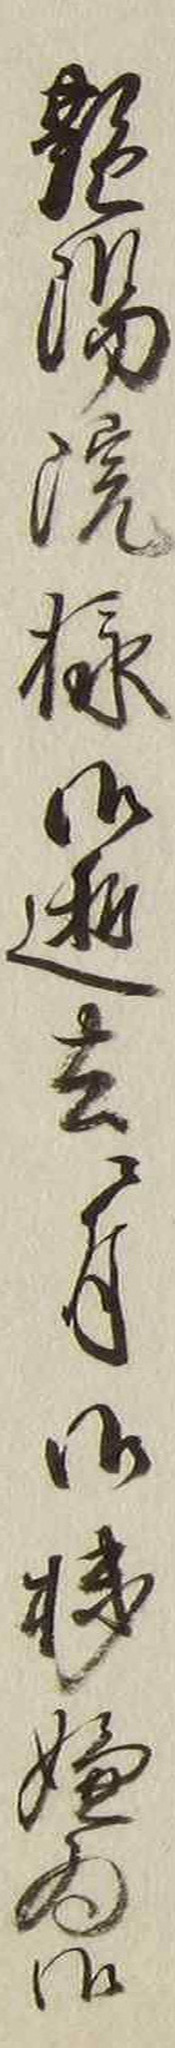艶陽院様御逝去ニ付御機嫌為御

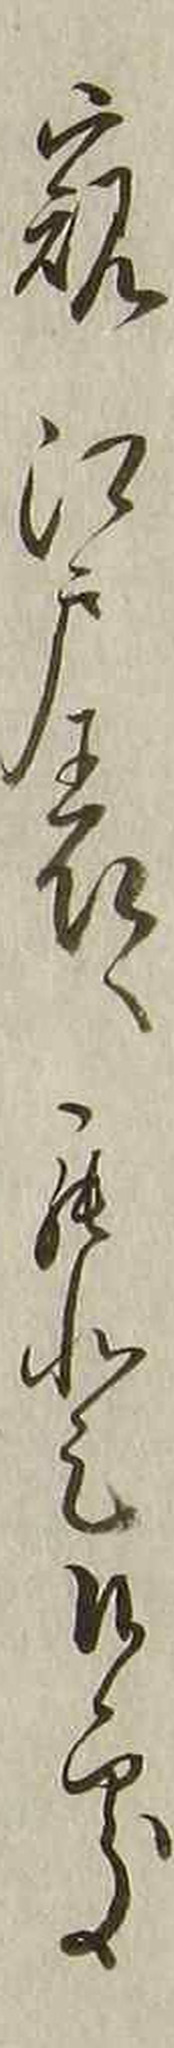窺江戸表へ罷登候処
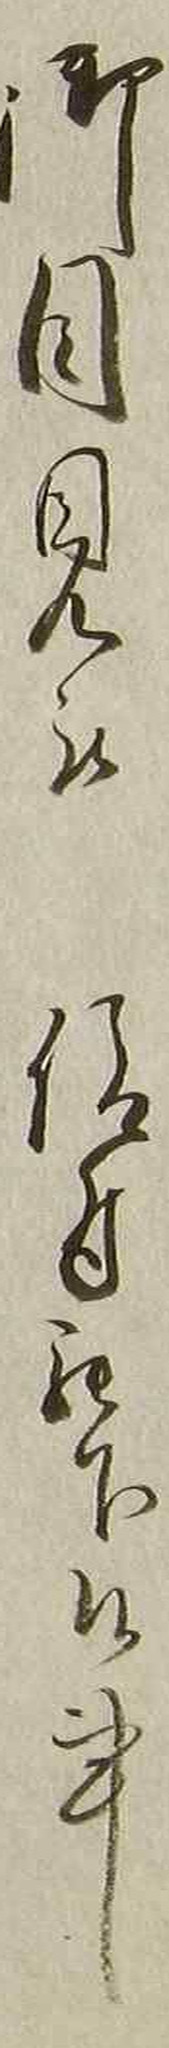御目見被仰付罷下候事
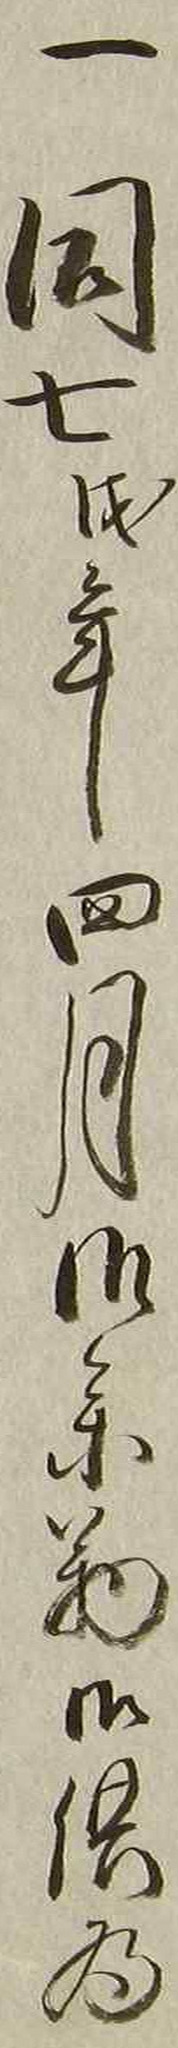一同七戌年四月御参勤御供為
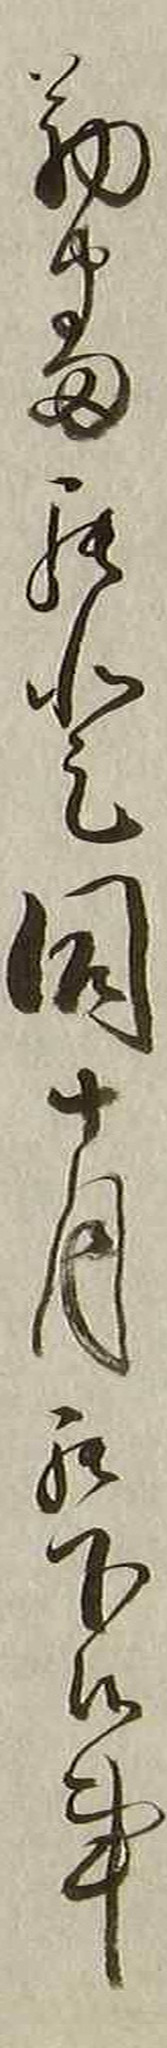勤番罷登同十月罷下候事
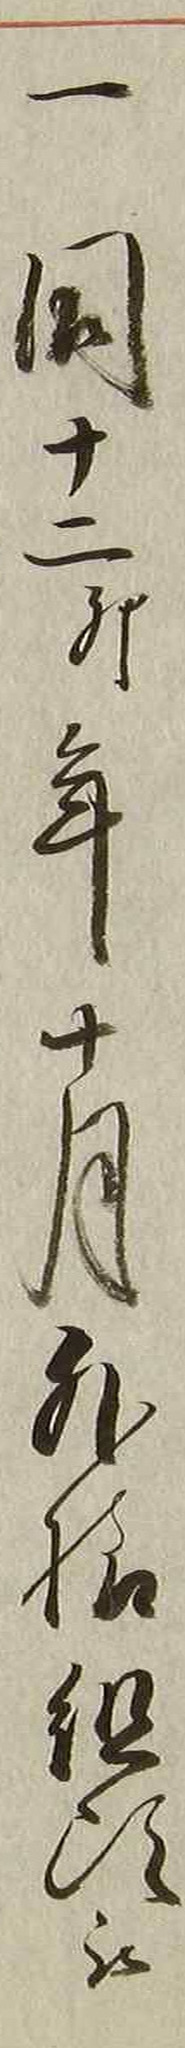一同十二卯年十月外様組頭被
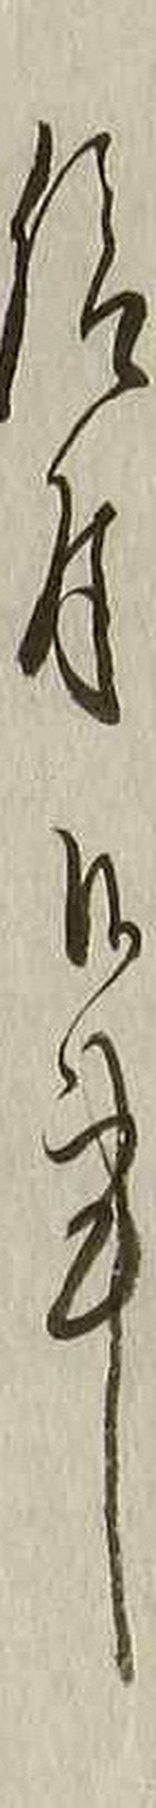仰付候事
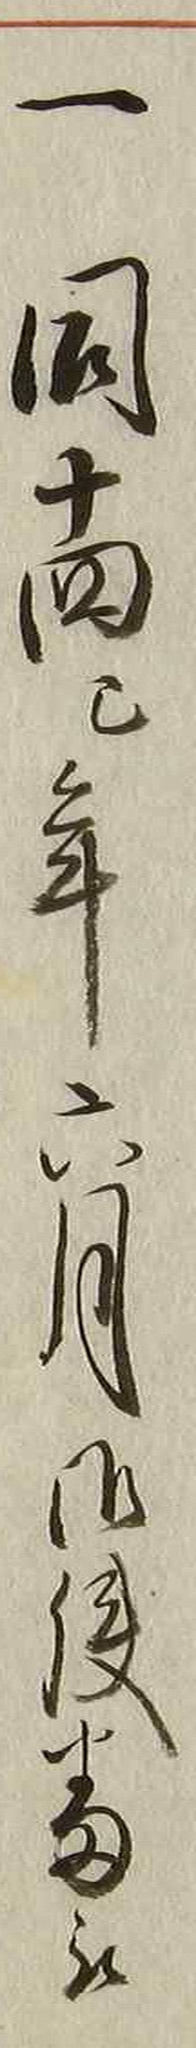一同十四巳年六月御使番被
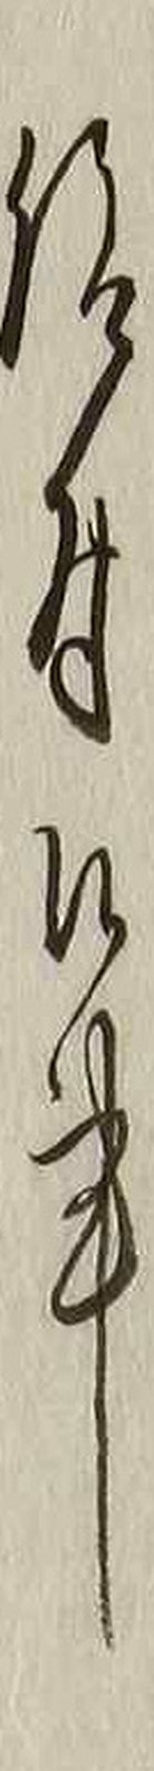仰付候事
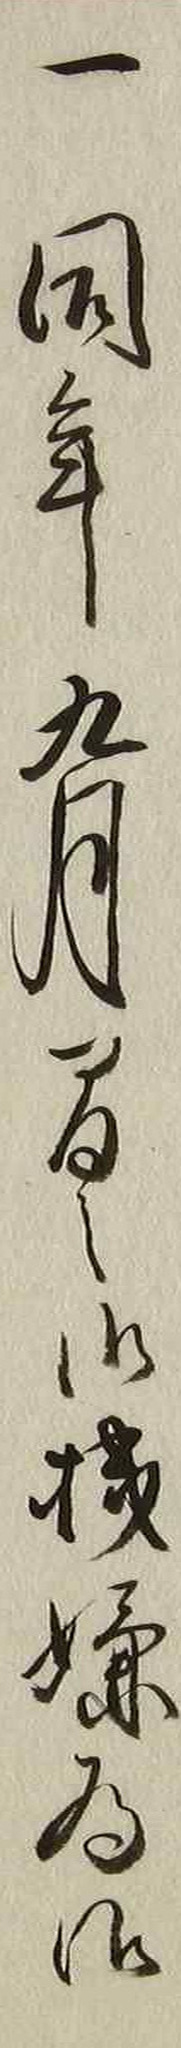一同年九月間之御機嫌為御
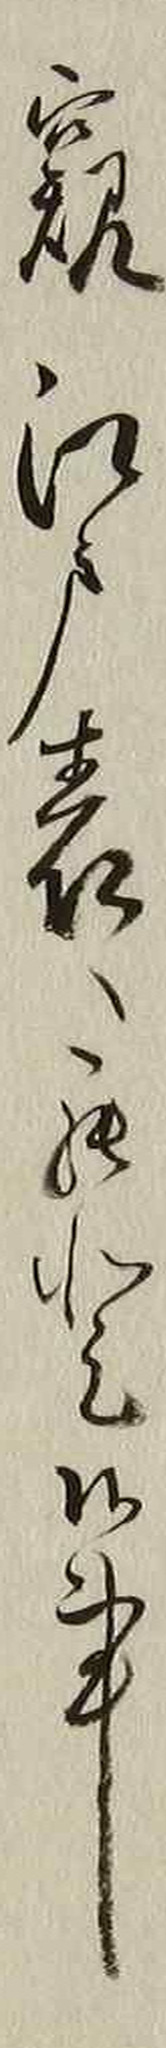窺江戸表へ罷登候事
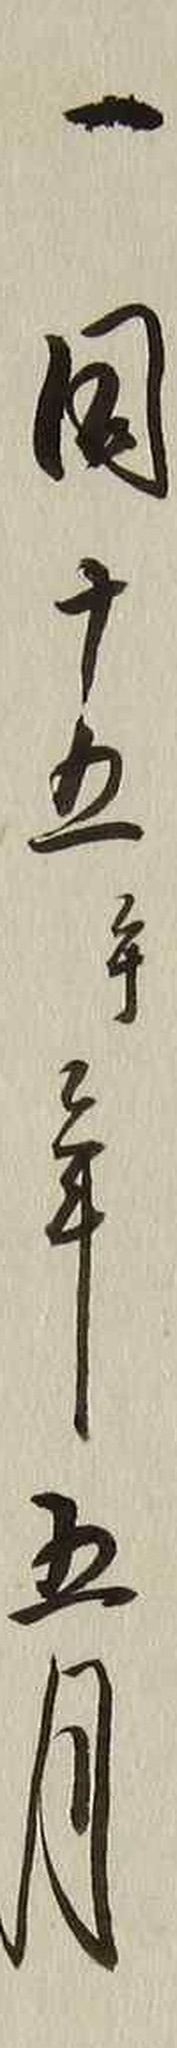一同十五午年五月
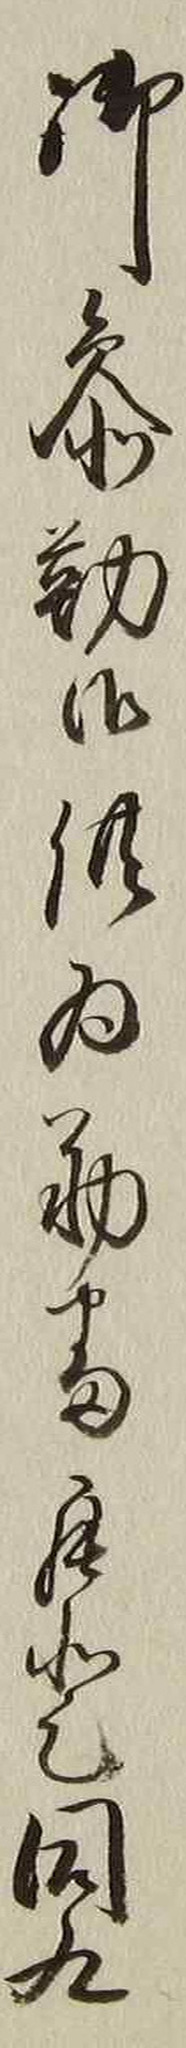御参勤御供為勤番罷登同九
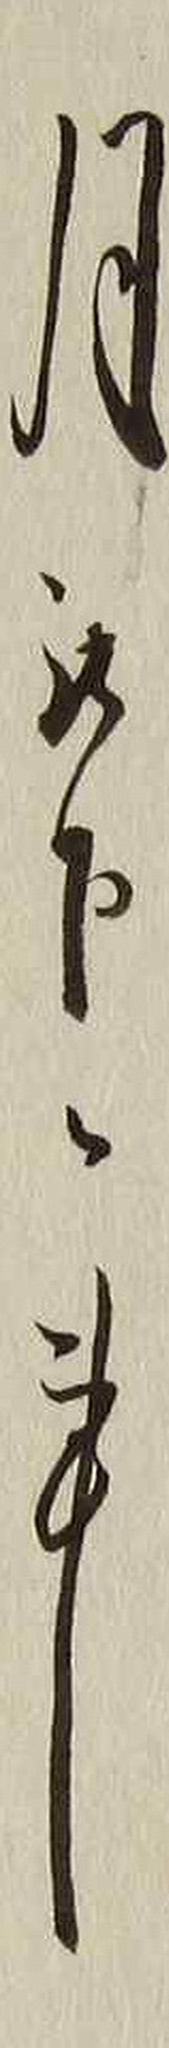月被下候事
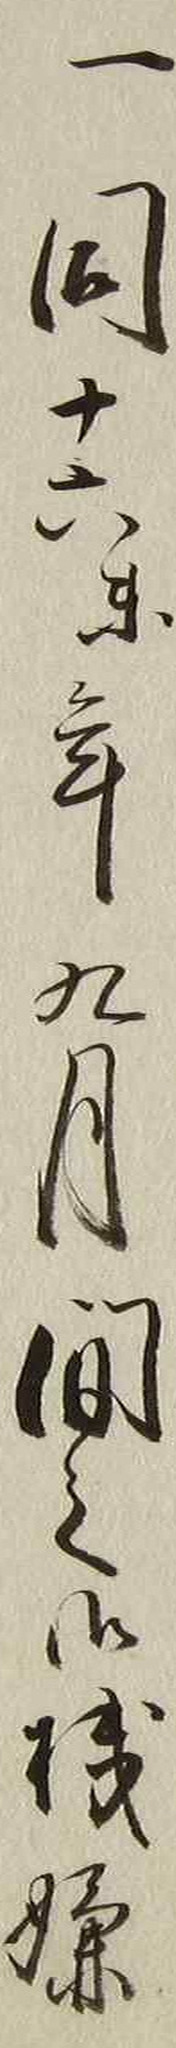一同十六未年九月間之御機嫌
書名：諸士系譜　巻之18　い之部18
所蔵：会津若松市立会津図書館
